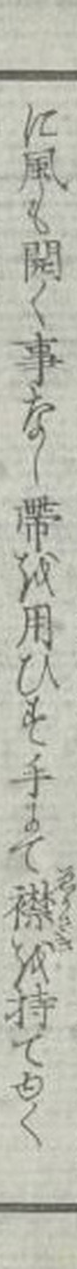に風も開く事なし帯を用ひす手にて襟を持てゆく
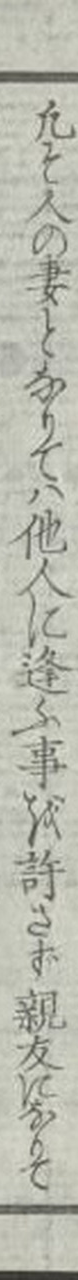凡そ人の妻となりては他人に逢ふ事を許さず親友になりて
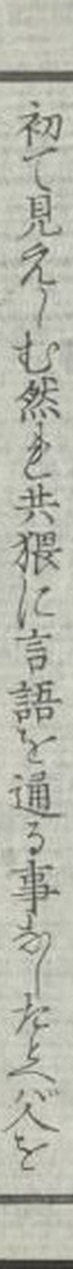初て見えしむ然れ共猥に言語を通る事なしたとへば人を
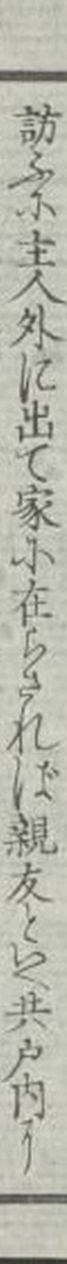訪ふに主人外に出て家に在らされば親友といへ共戸内に
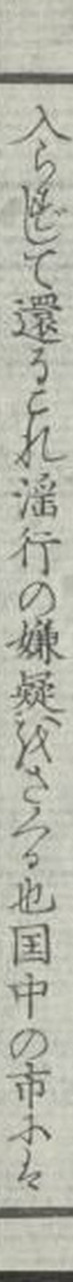入らずして還るこれ淫行の嫌疑をさくる也国中の市には
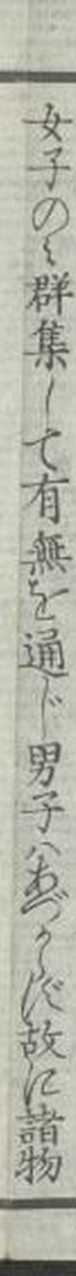女子のみ群集して有無を通じ男子はあづからず故に諸物
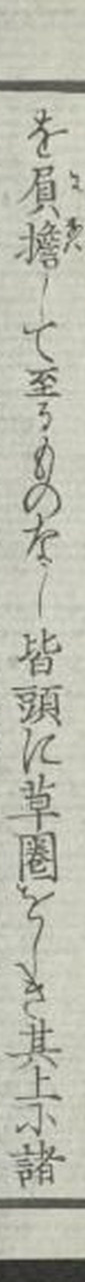を負担して至るものなし皆頭に草圏をしき其上に諸
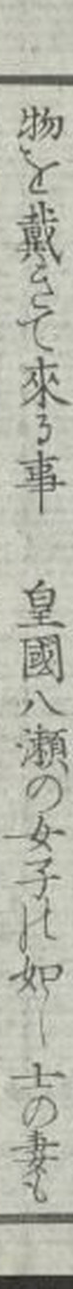物を戴きて来る事皇国八瀬の女子の如し士の妻も
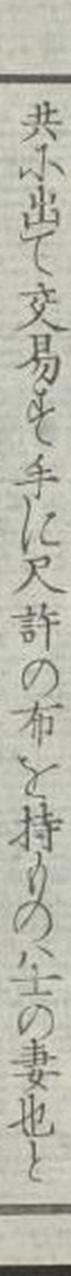共に出て交易す手に尺許の布を持ものは士の妻也と
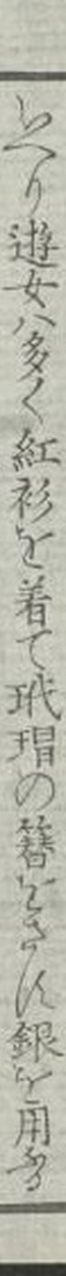いへり遊女は多く紅衫を着て玳瑁の簪をさす銀を用ふる
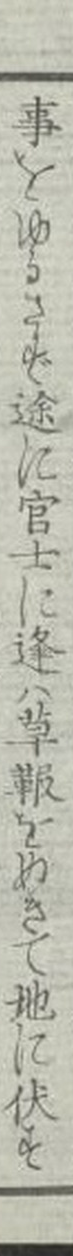事をゆるさず途に官士に逢は草靸をぬきて地に伏す
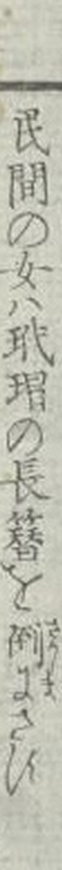民間の女は玳瑁の長簪を倒にさす
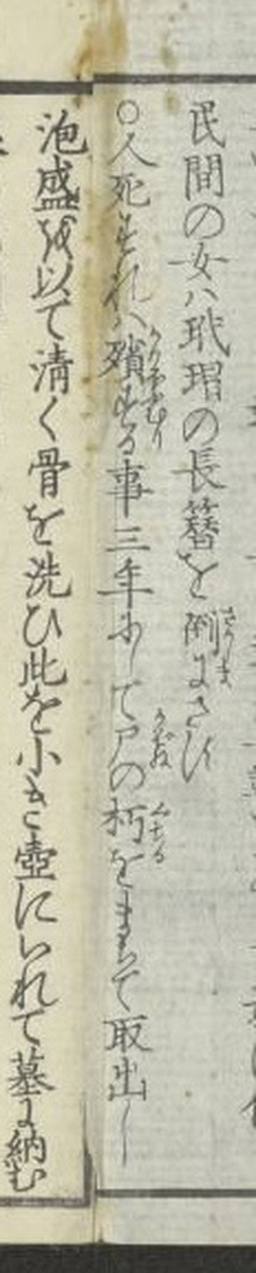○人死すれは殯する事三年にして尸の朽をまちて取出し
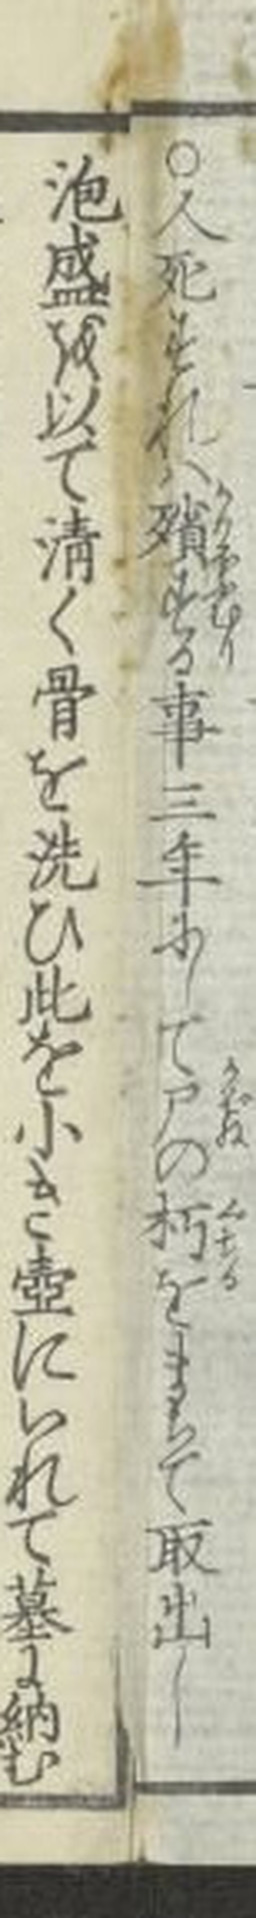泡盛を以て清く骨を洗ひ此を小き壺にいれて墓に納む
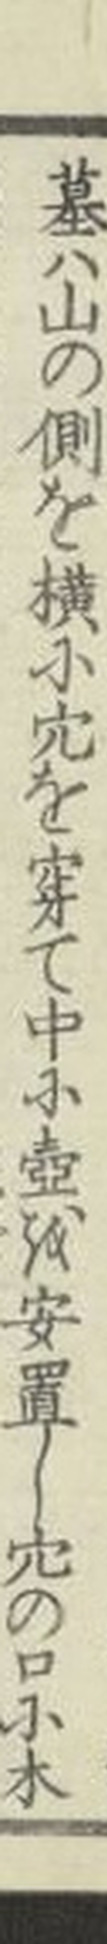墓は山の側を横に穴を穿て中に壺を安置し穴の口に木
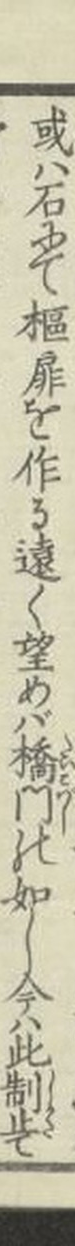或は石にて枢扉を作る遠く望めば橋門の如し今は此制止て
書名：中山国使略
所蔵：University of the Ryukyus Library
